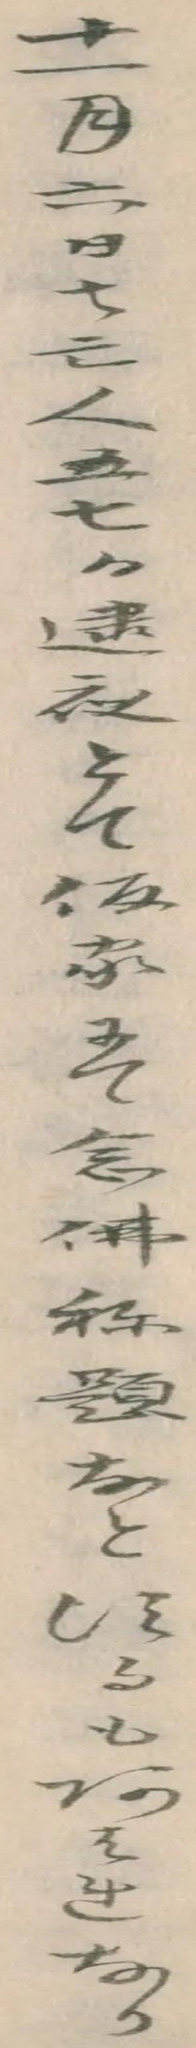十一月六日は亡人五七日か逮夜とて仮家にて念仏称題なとするもあはれなり
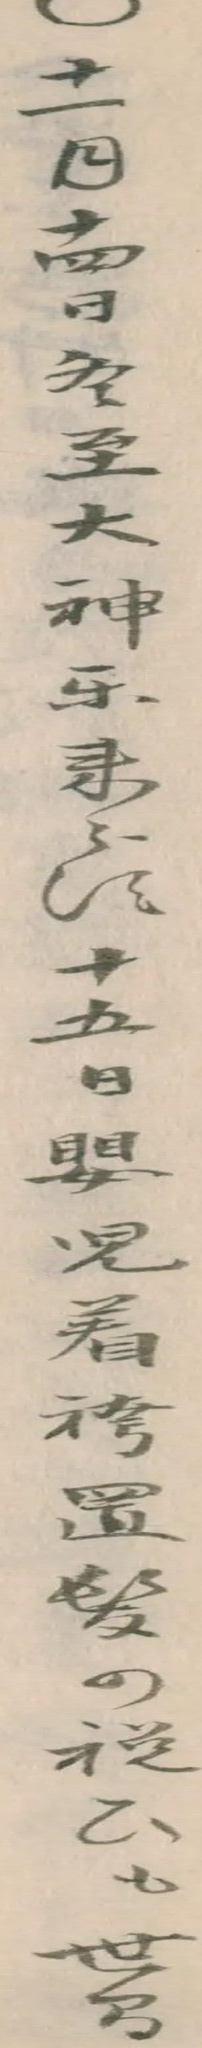〇十一月十四日冬至大神楽来らす十五日嬰児着袴置髪の祝ひも世間
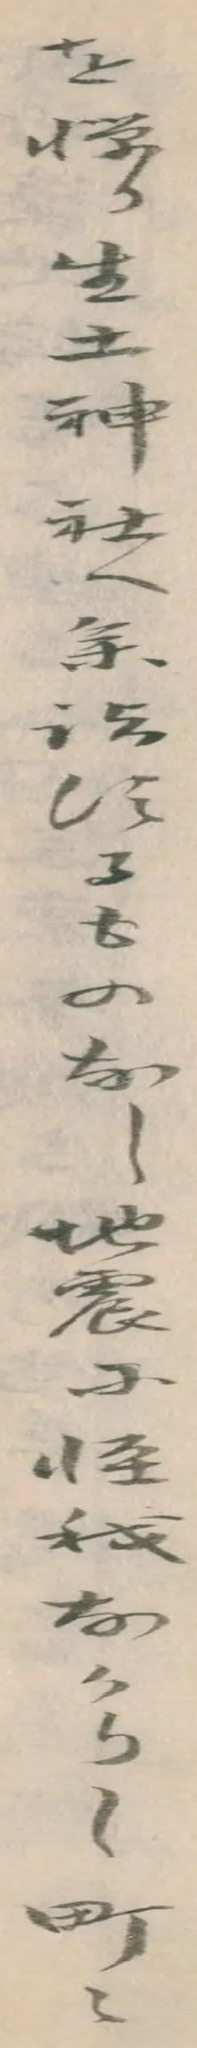を憚り生土神社へ参詣するものなし地震に怪我なかりし町々
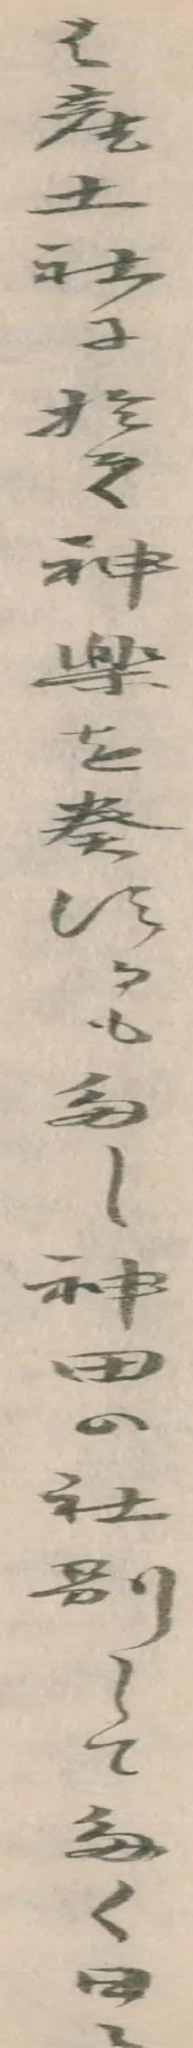は産土社に於て神楽を奏するも多し神田の社別して多く日々
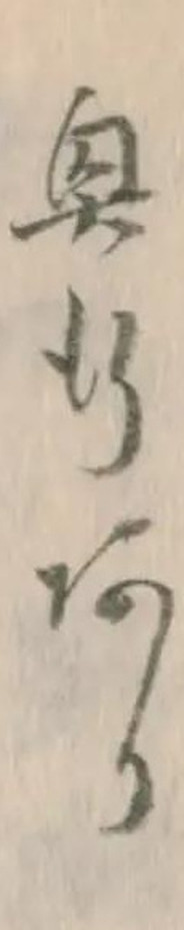興行あり
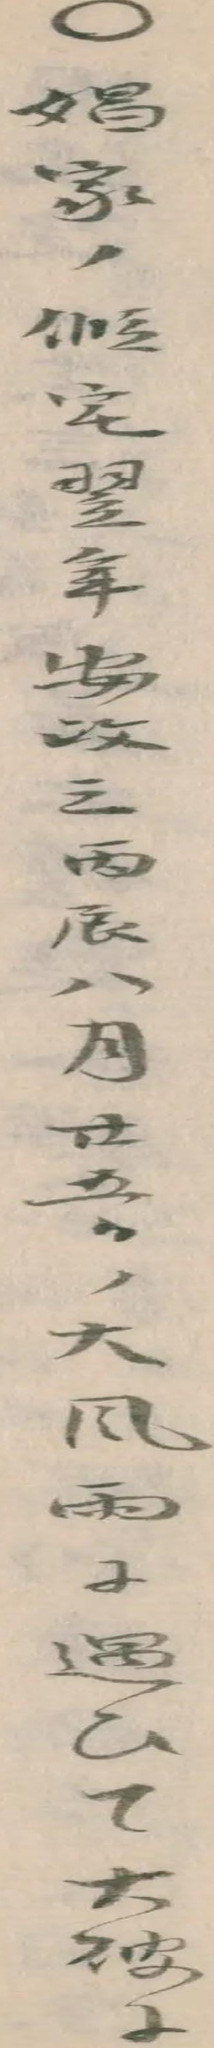〇娼家ノ仮宅翌年安政三丙辰八月廿五日ノ大風雨に遇ひて大破に
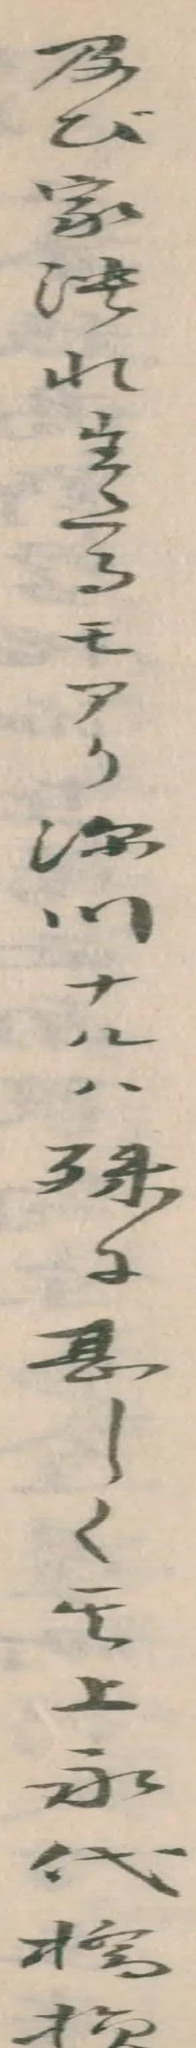及び家潰れ生たるモアリ深川ナルハ殊に甚しく其上永代橋損
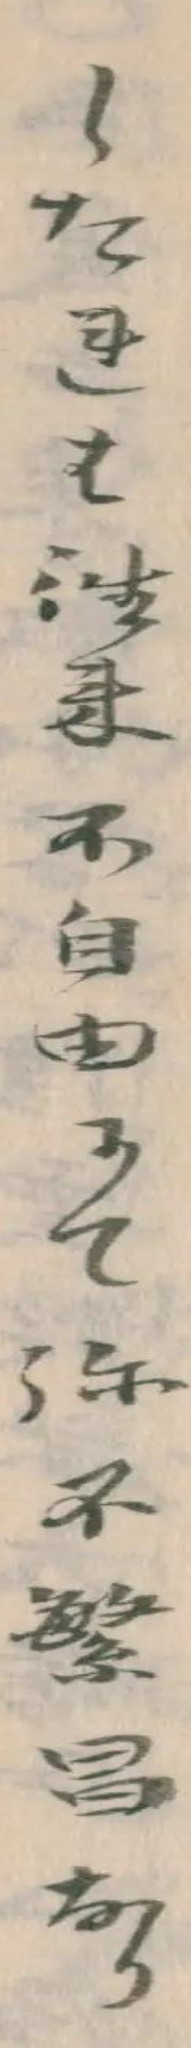したれは往来不自由にて弥不繁昌なり
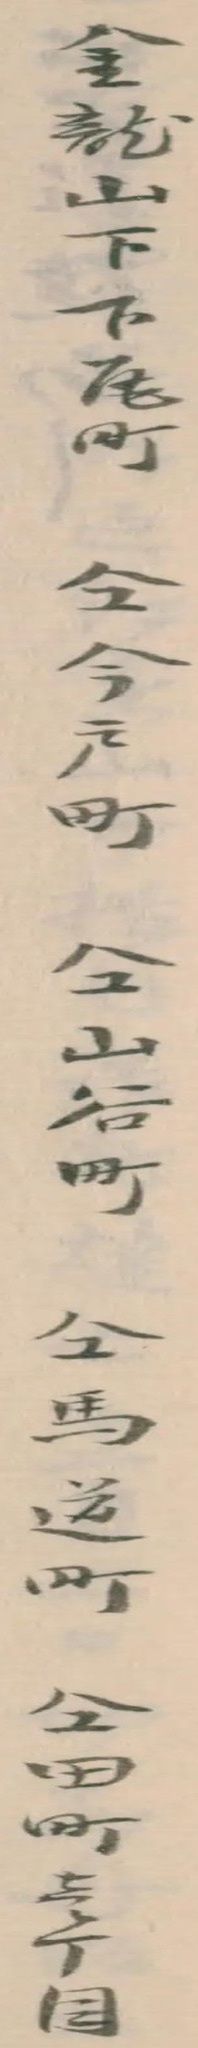金龍山下下瓦町仝今戸町仝山谷町仝馬道町仝田町壱丁目
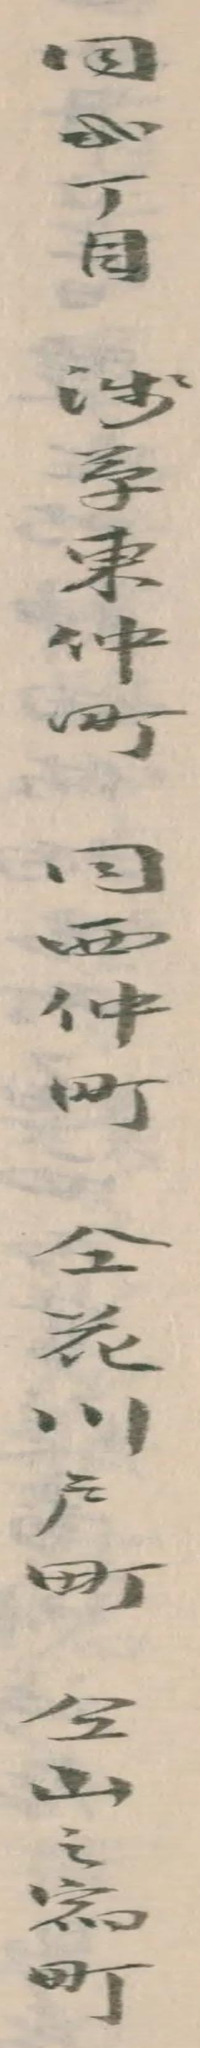同弐丁目浅草東仲町同西仲町仝花川戸町仝山之宿町
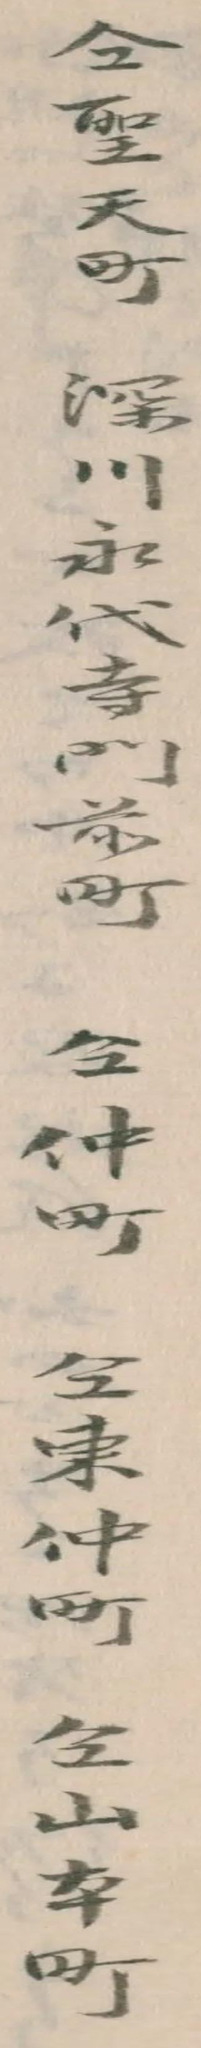仝聖天町深川永代寺門前町仝仲町仝東仲町仝山本町
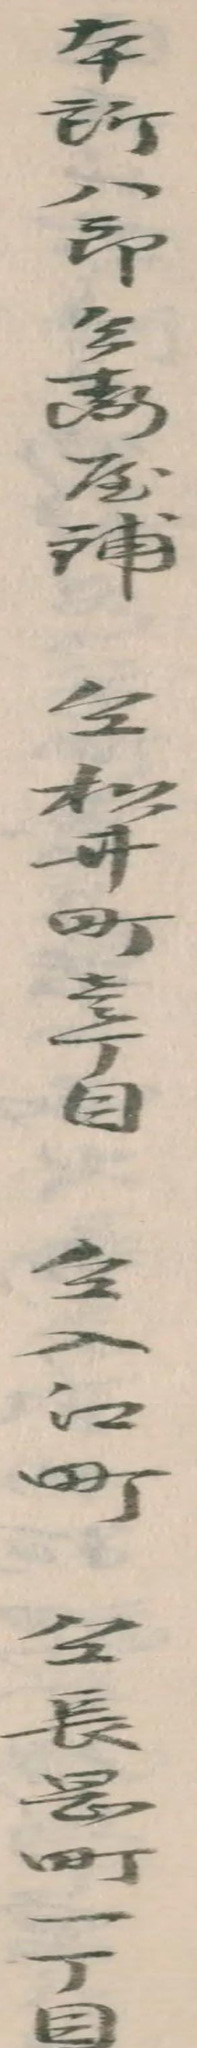本所八郎兵衛屋鋪仝松井町壱丁目仝入江町仝長岡町一丁目
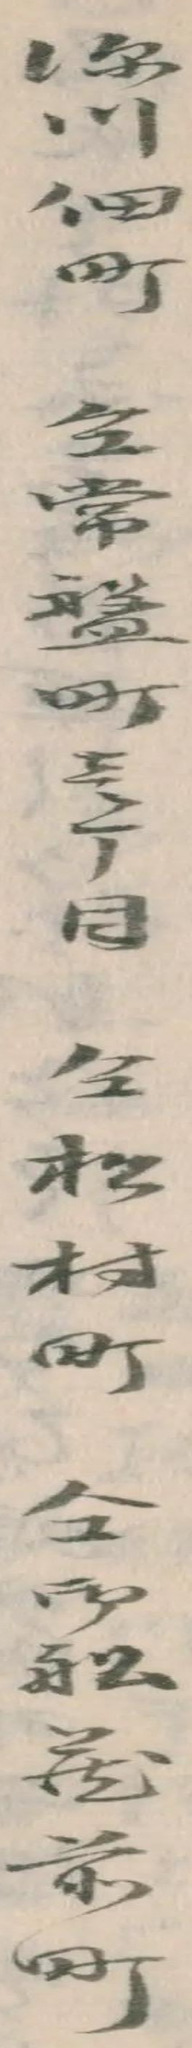深川佃町仝常盤町壱丁目仝松村町仝御船蔵前町
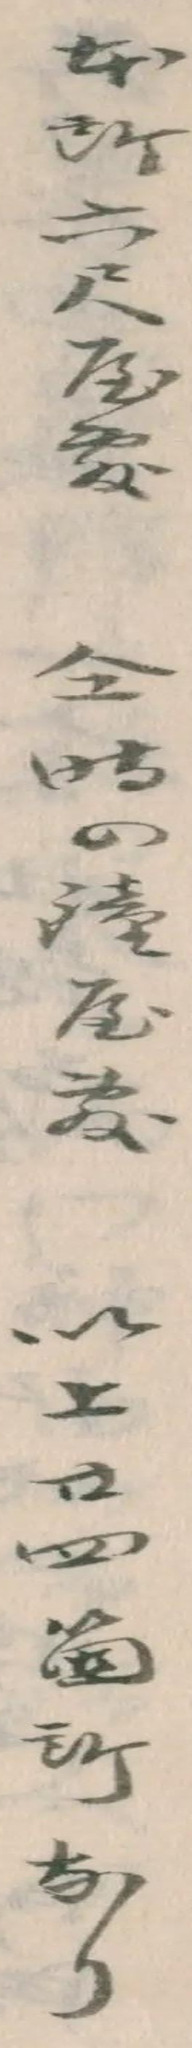本所六尺屋敷仝時の鐘屋敷以上廿四箇所なり
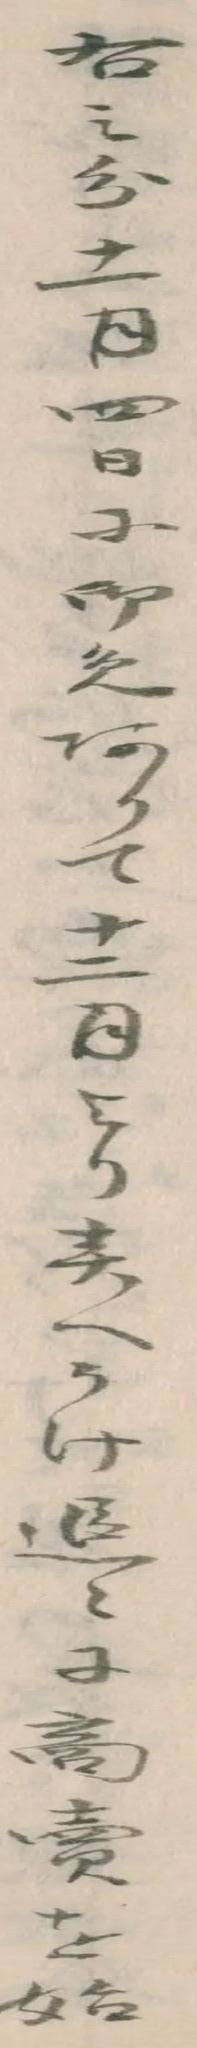右之分十一月四日に御免ありて十二月より春へかけ追々に商売を始
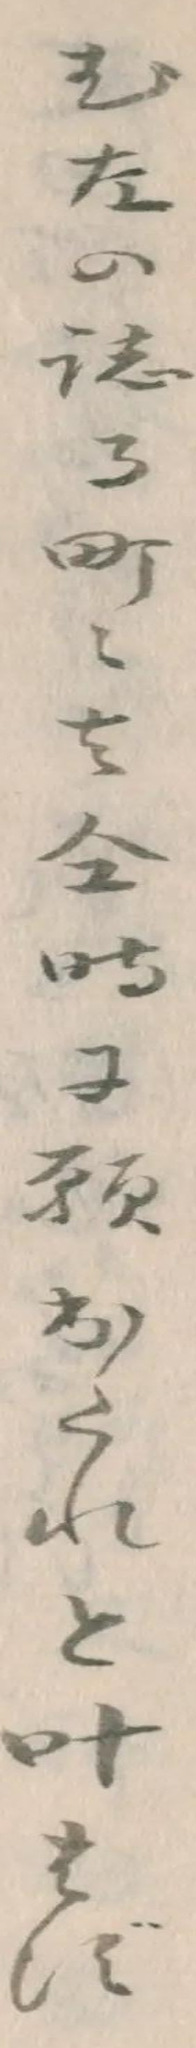む左の誌る町々は仝時に願出たれと叶はず
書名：地災撮要. 巻7-9(地震之部)
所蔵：国立国会図書館 National Diet Library, JAPAN
